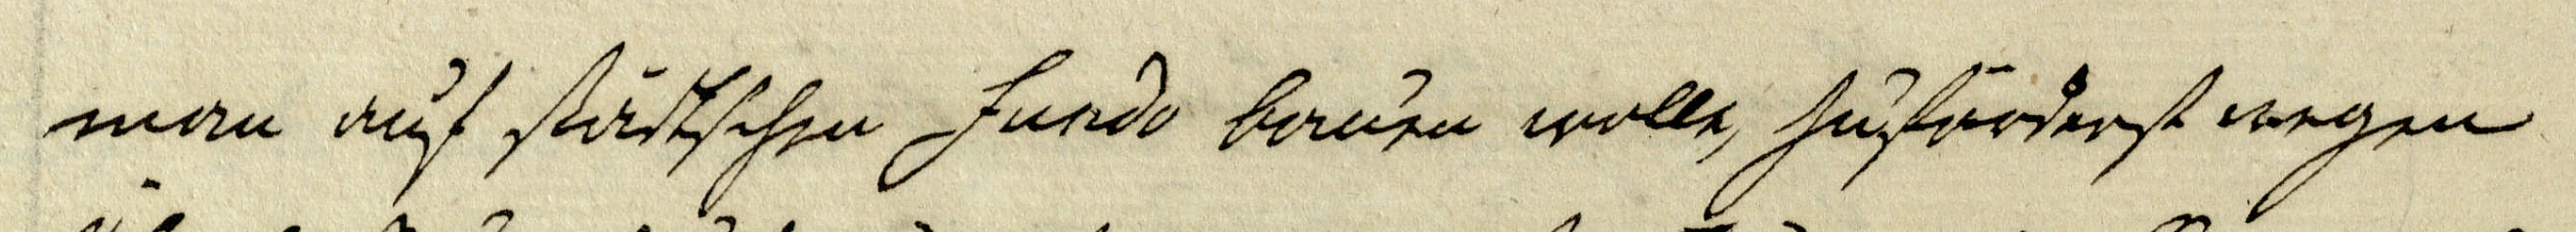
man auf städtschen fundo bauen wolle, zuförderst wegen
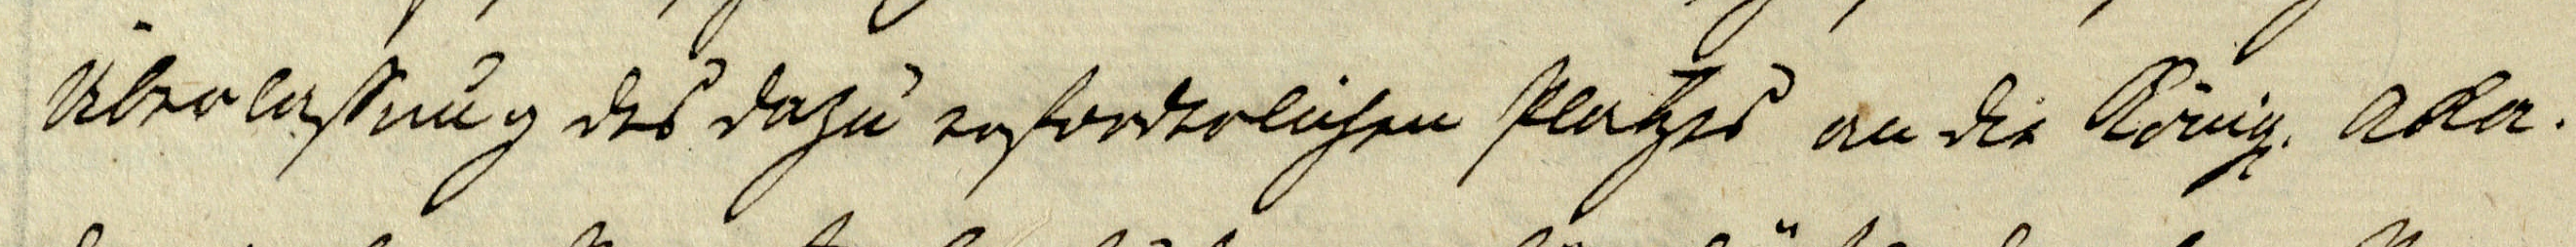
Überlassung des dazu erforderlichen Platzes an die König. Aka¬
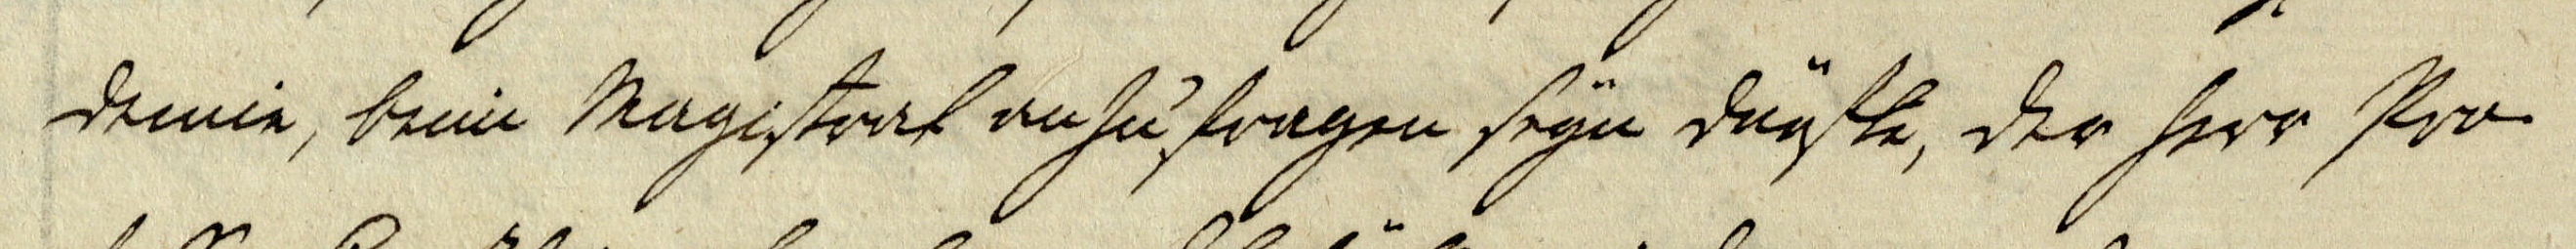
demie, beim Magistrat anzufragen seÿn dürfte, der Herr Pro¬
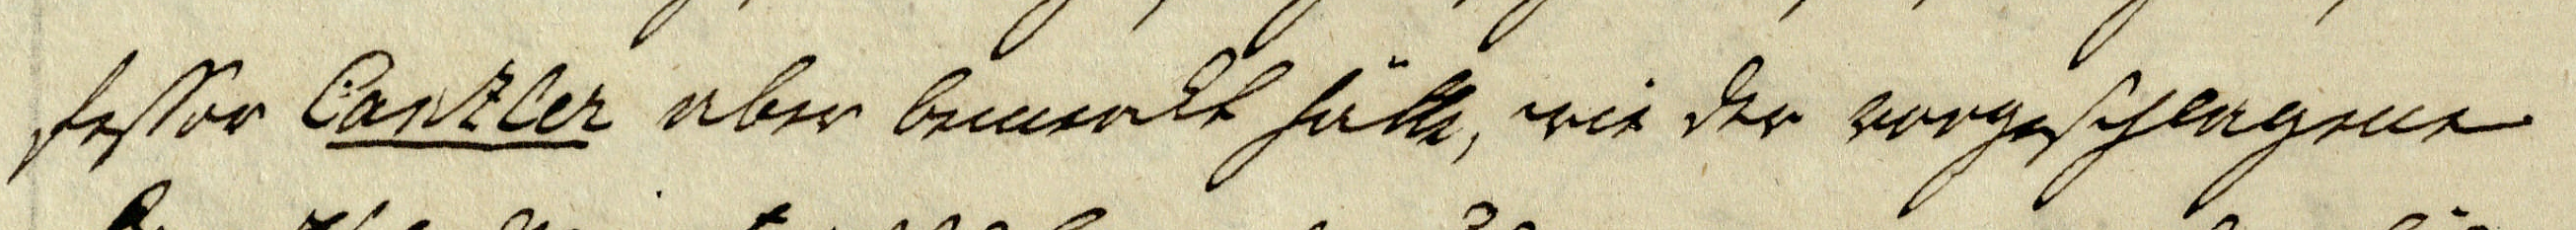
fessor Canzler aber bemerckt hätte, wie der vorgeschlagene
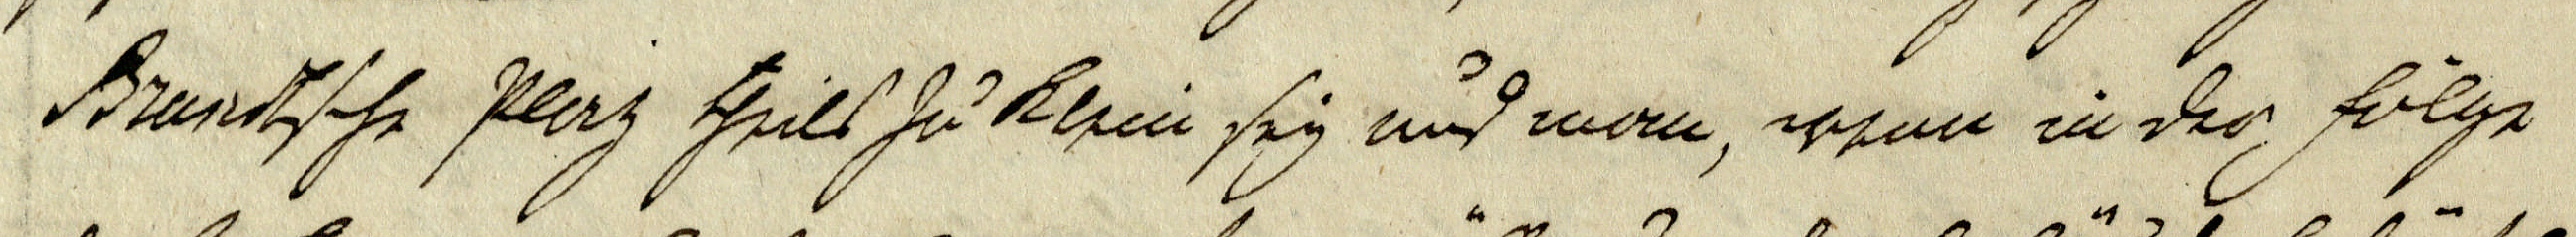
Brandtsche Platz theils zu klein seÿ und man, wenn in der Folge
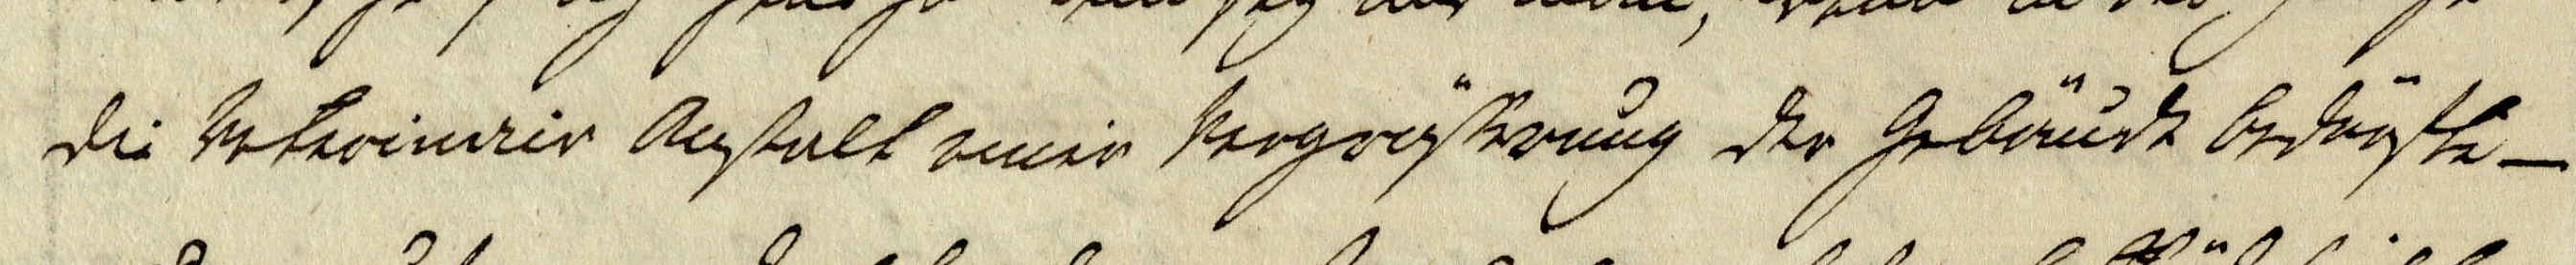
die Veterinair Anstalt einer Vergrösserung der Gebäude bedürfte -
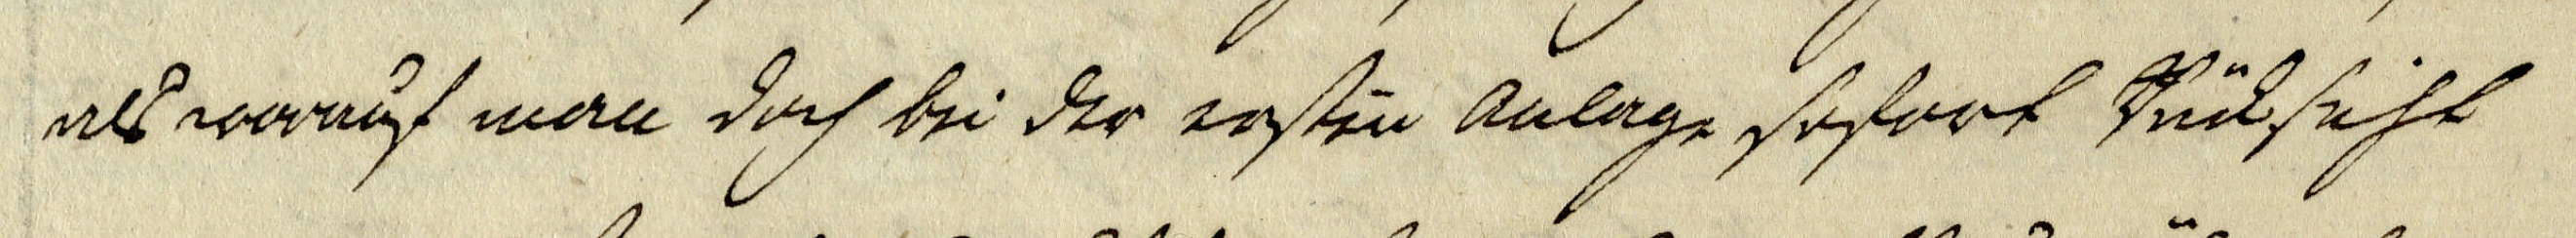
als worauf man doch bei der ersten Anlage sofort Rücksicht
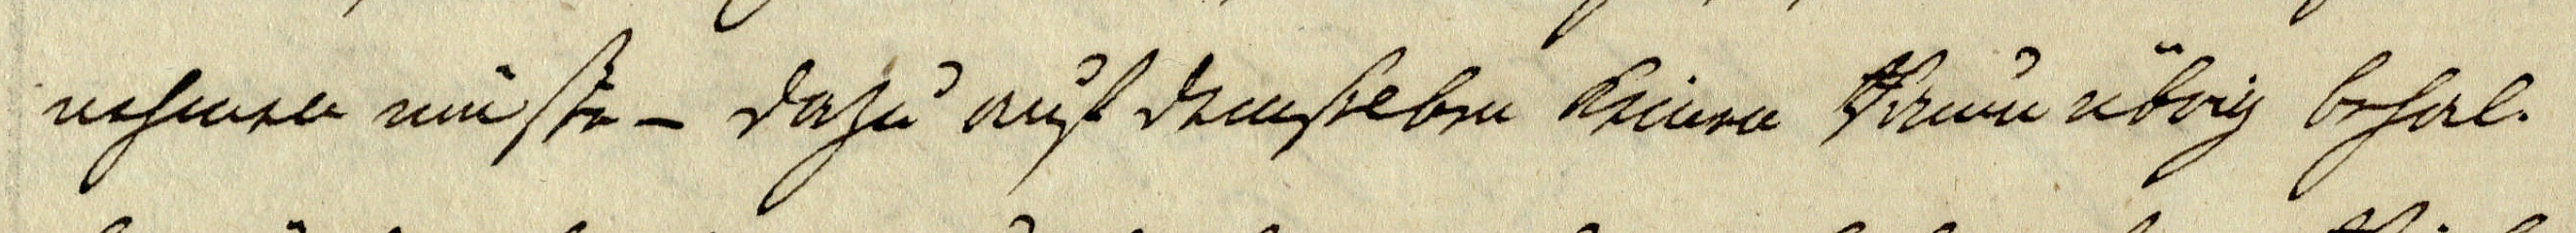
nehmen müßte - dazu auf demselben keinen Raum übrig behal¬
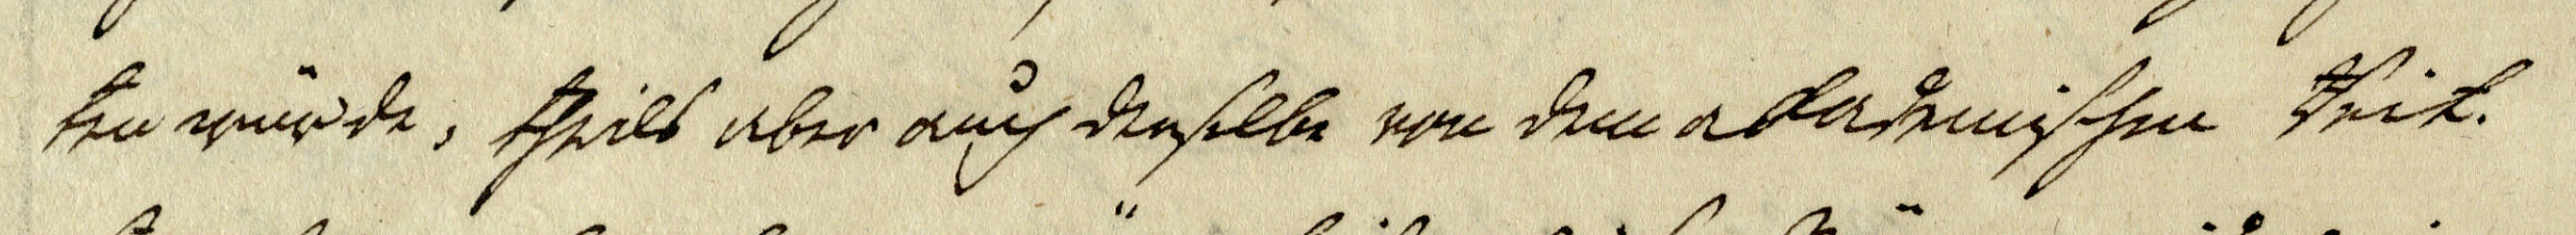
ten würde, theils aber auch derselbe von dem akademischen Reit¬
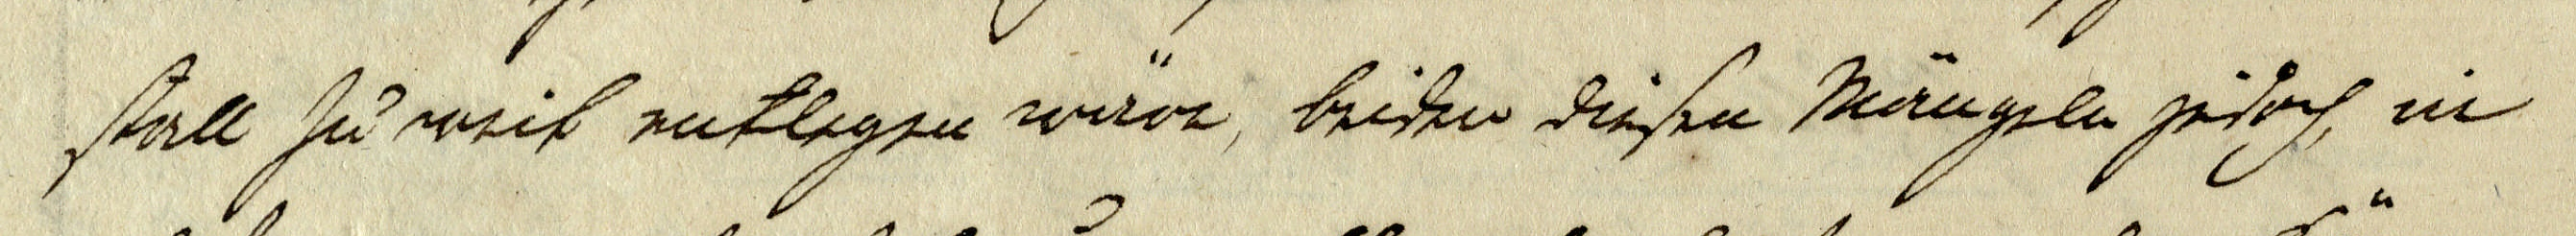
stall zu weit entlegen wäre, beiden diesen Mängeln jedoch, in
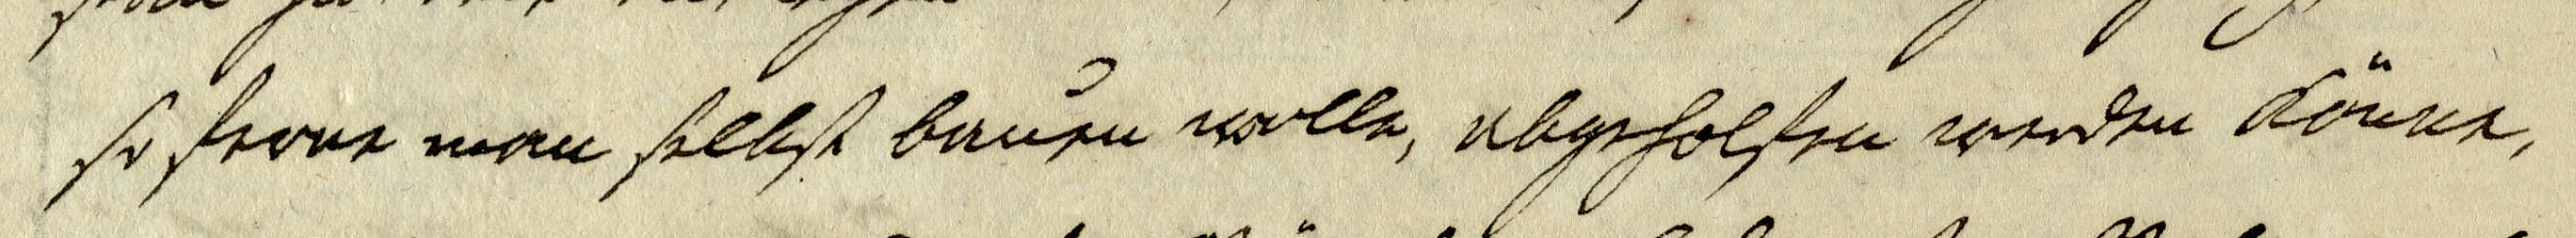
so ferne man selbst bauen wolle, abgeholfen werden könne,
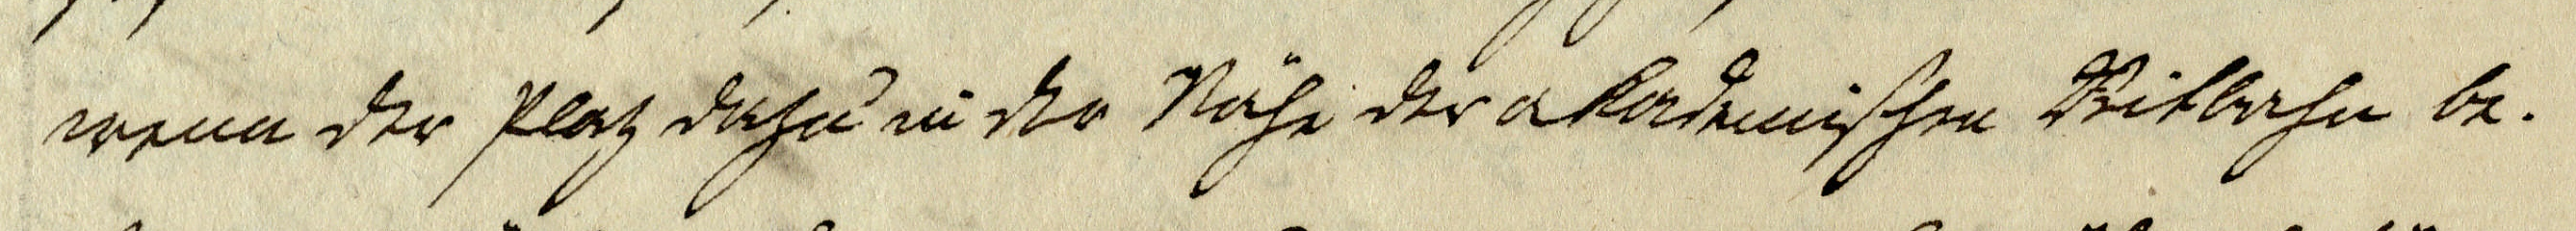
wenn der Platz, dazu in der Nähe der akademischen Reitbahn be¬
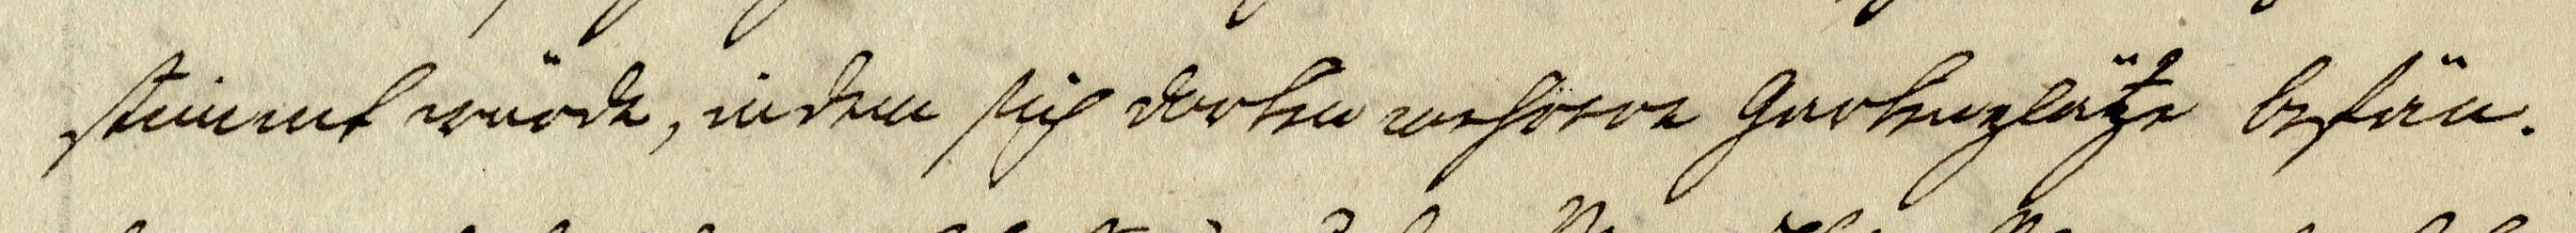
stimmt würde, indem sich dorten mehrere Gartenplätze befän¬
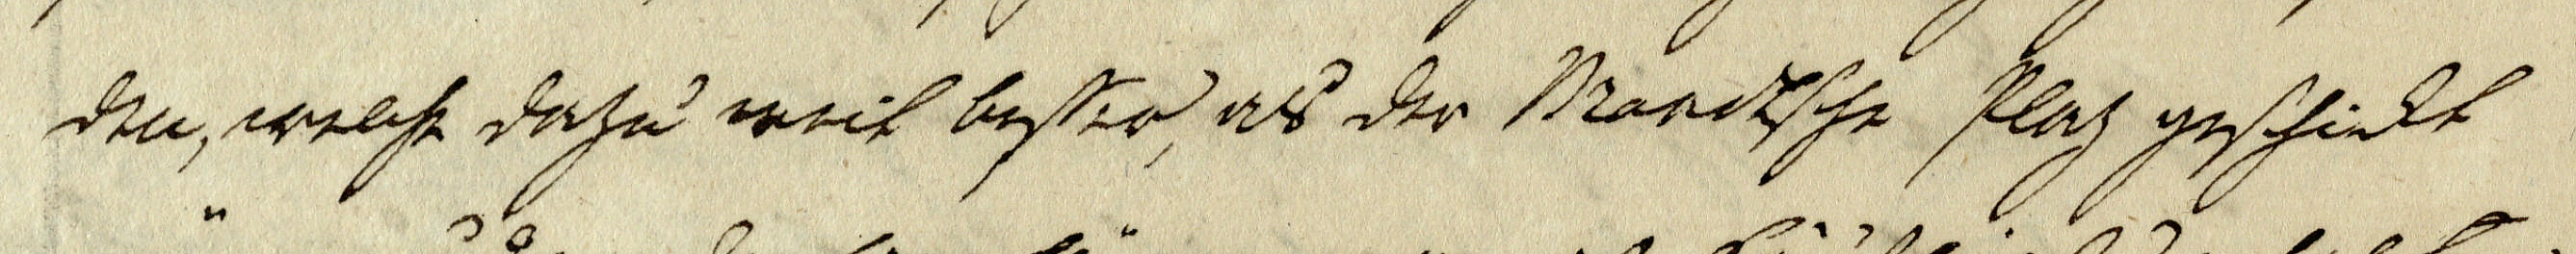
den, welche dazu weit besser, als der Brandtsche Platz geschickt
